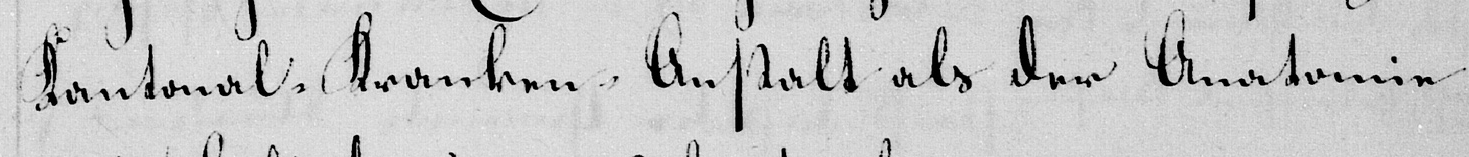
Kantonal-Kranken-Anstalt als der Anatomie
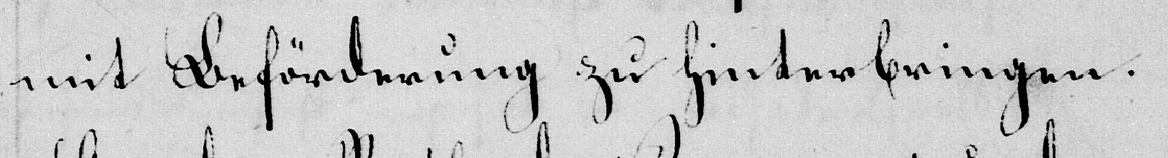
mit Beförderung zu hinterbringen.
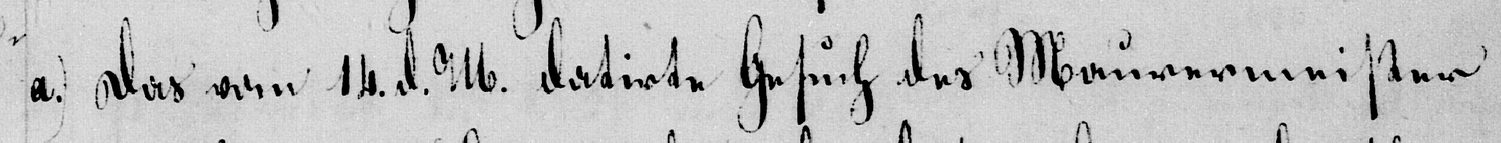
a.) Das vom 14. d. M. datirte Gesuch des Maurermeister
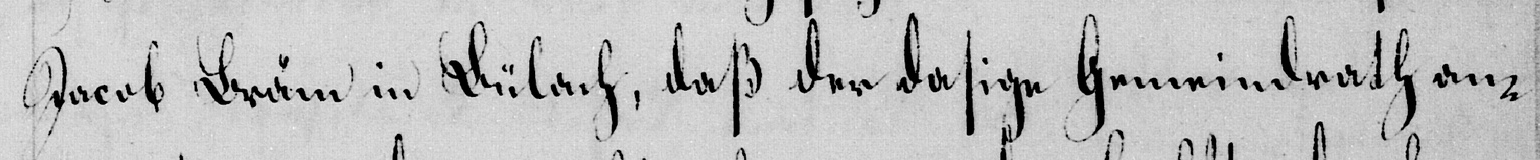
Jacob Bräm in Bülach, daß der dortige Gemeindrath an¬
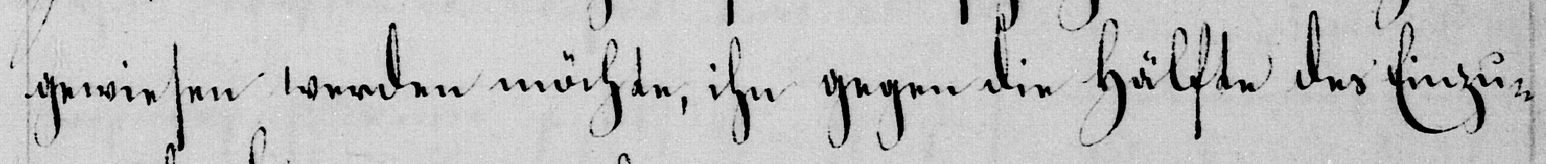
gewiesen werden möchte, ihn gegen die Hälfte des Einzu¬
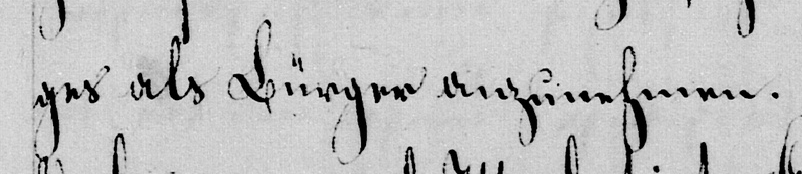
ges als Bürger aufzunehmen.
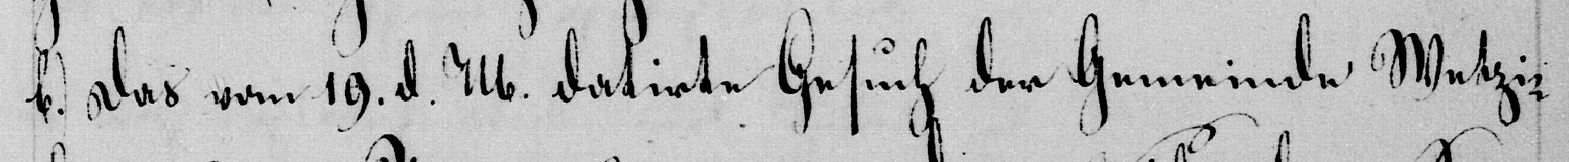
b.) Das vom 19. d. M. datirte Gesuch der Gemeinde Wetzi¬
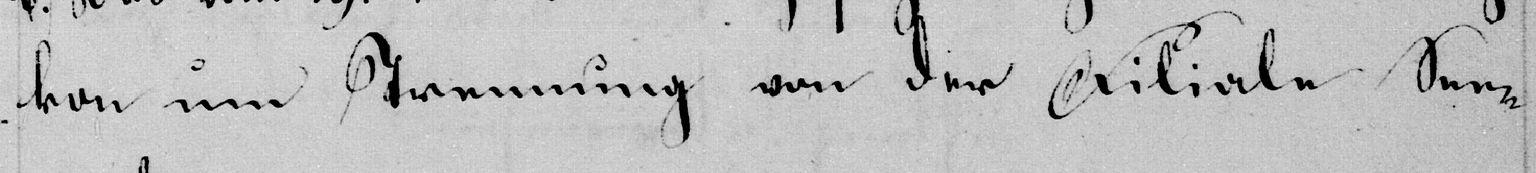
kon um Trennung von der Filiale See¬
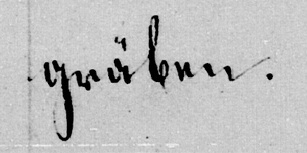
gräben.
